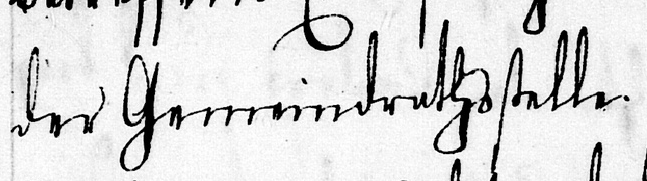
der Gemeindrathsstel¬
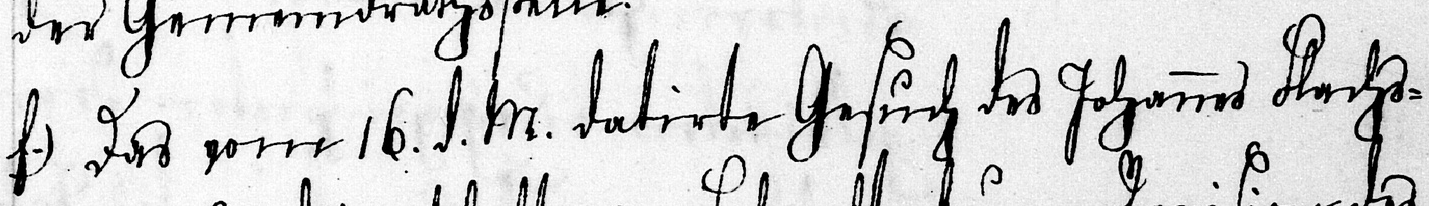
f.) Das vom 16. d. M. datirte Gesuch des Johannes Flachs¬
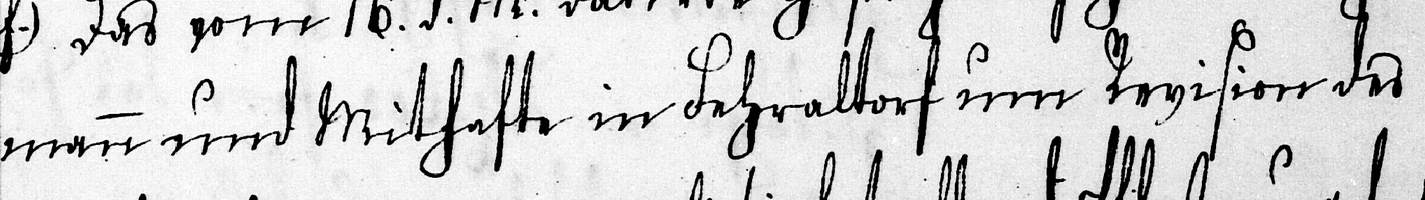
mann und Mithafte in Fehraltorf um Revision des
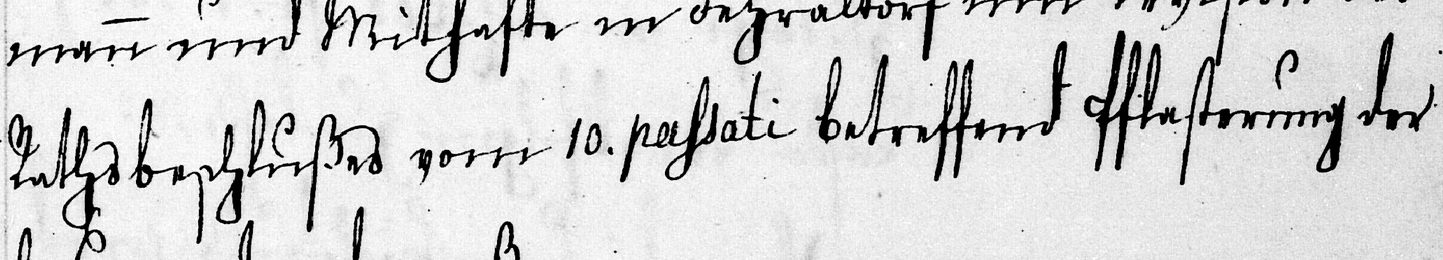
Rathsbeschlußes vom 10. passati betreffend Pflasterung der
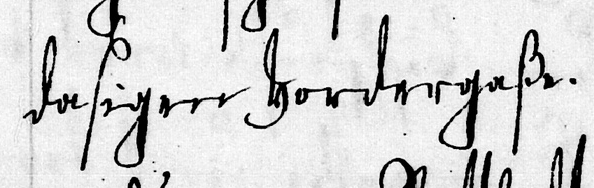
dasigen Vordergaße.
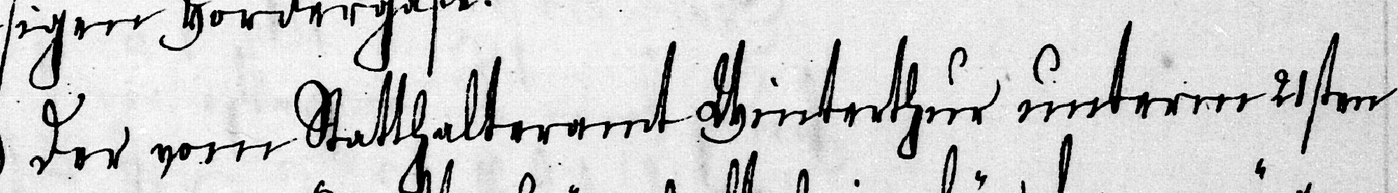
Der vom Statthalteramt Winterthur unterm 21sten
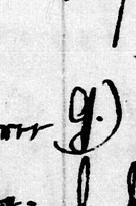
g.)
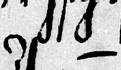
d. M.
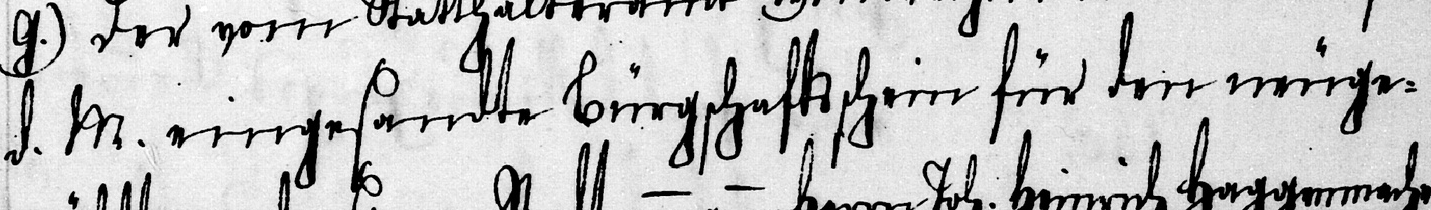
d. M. eingesandte Bürgschaftsschein für den neuge¬
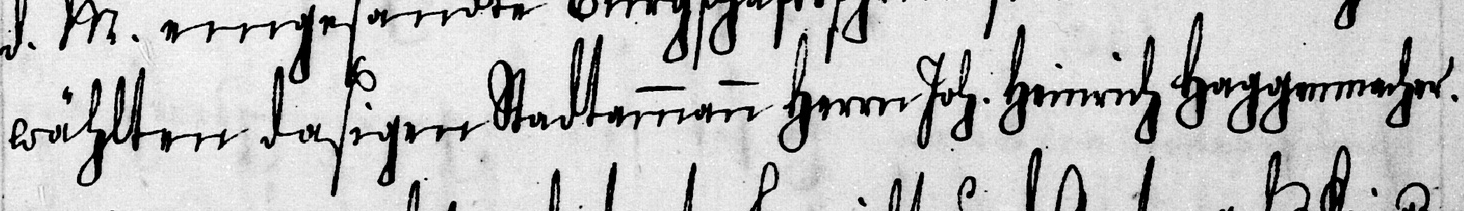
wählten dasigen Stadtammann Joh. Heinrich Haggenmacher.
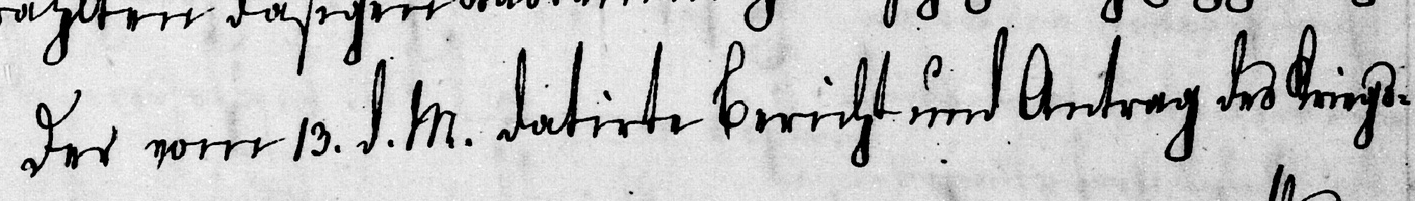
Der vom 13. d. M. datirte Bericht und Antrag des Kriegs-
